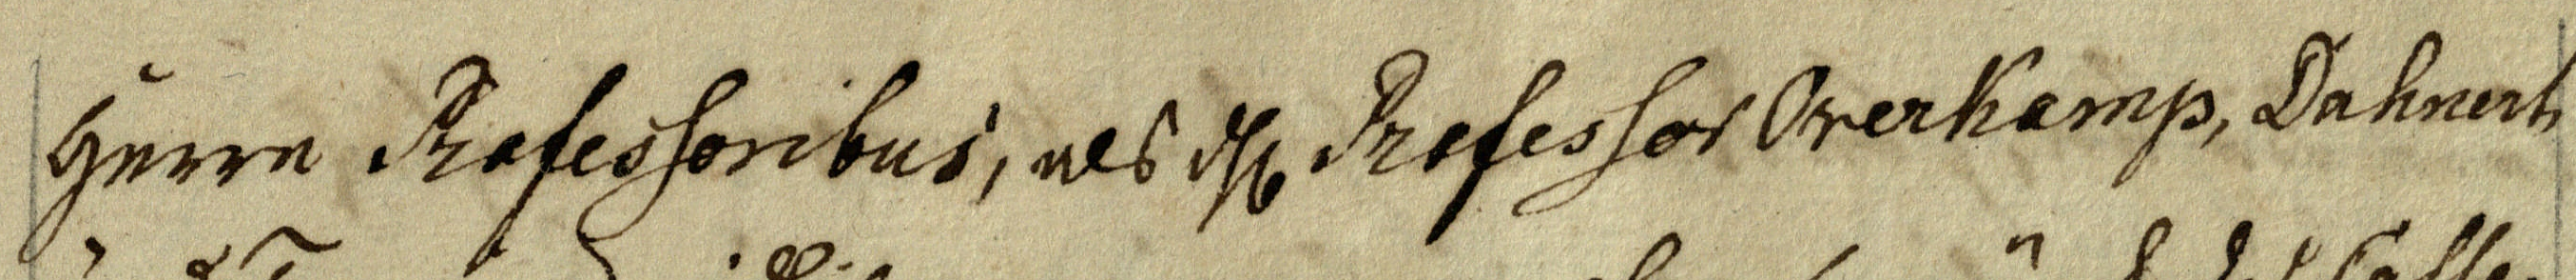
Hern Professoribus, als dh Professor Overkamp, Dähnert,
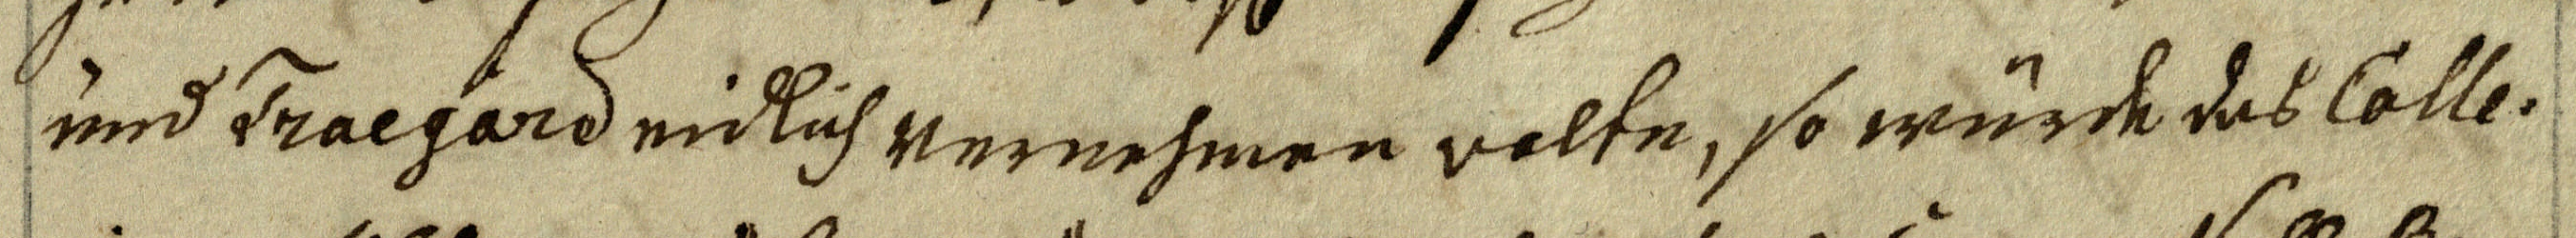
und Traegård eidlich vernehmen wolte, so würde das Colle¬
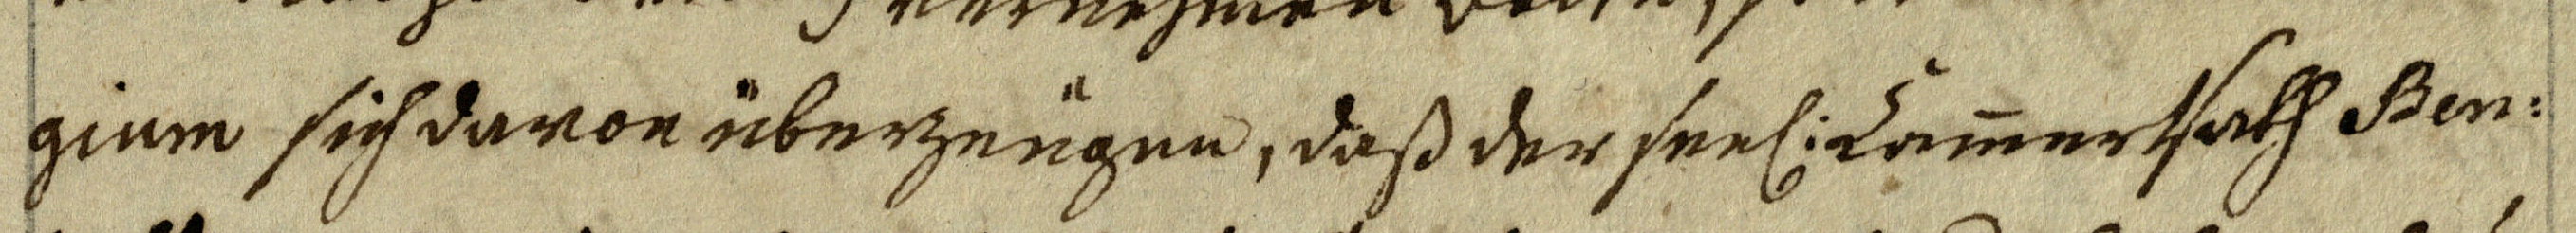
gium sich davon überzeugen, daß der seel. CamerRath Ben¬
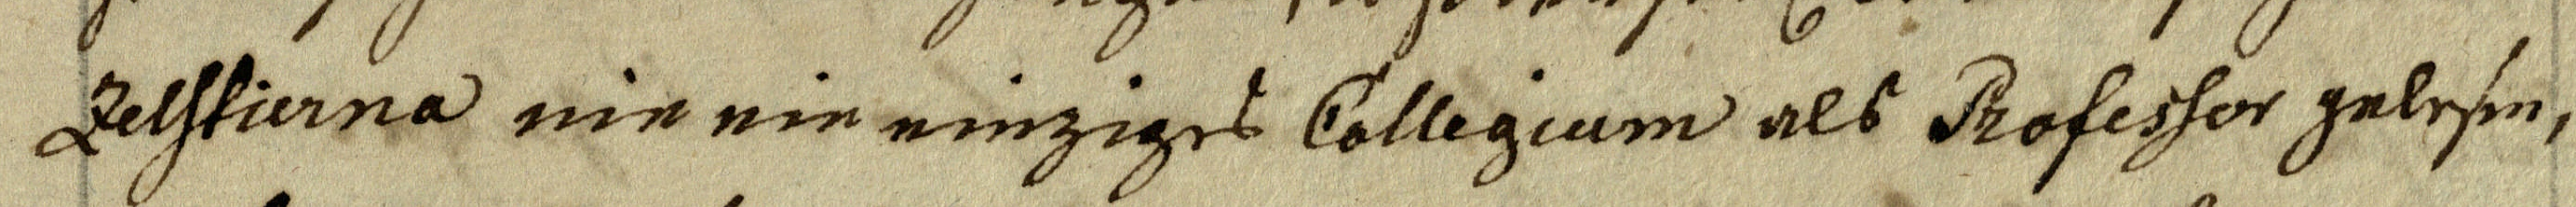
zelstierna nie ein einziges Collegium als Professor gelesen,
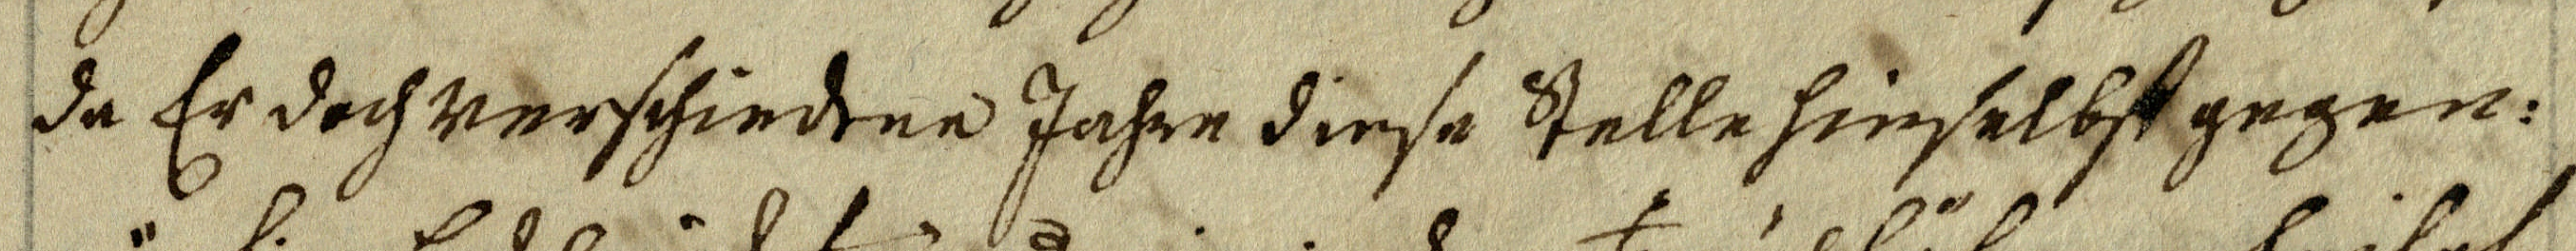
da Er verschiedene Jahre diese Stelle hieselbst gegen¬
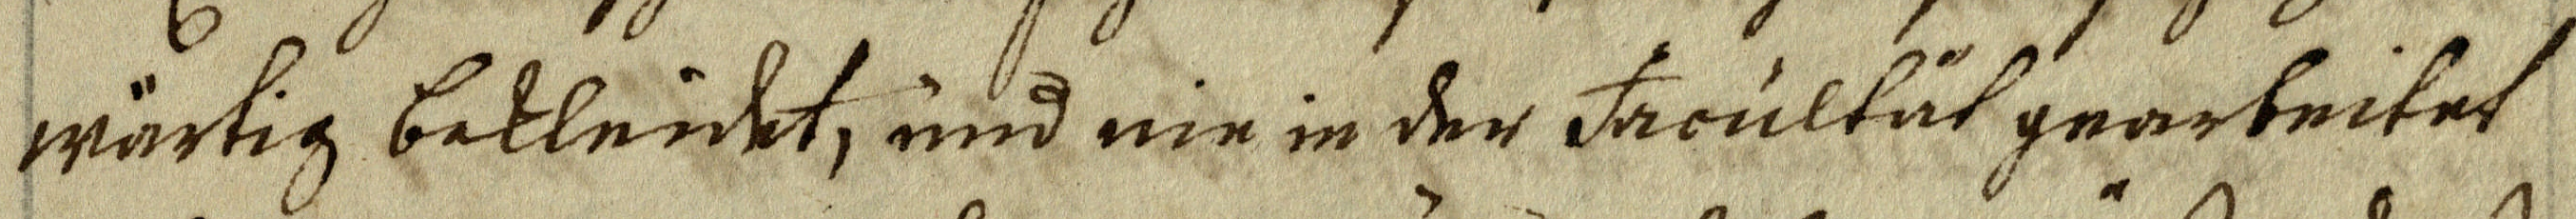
wärtig bekleidet, und nie in der Facultät gearbeitet
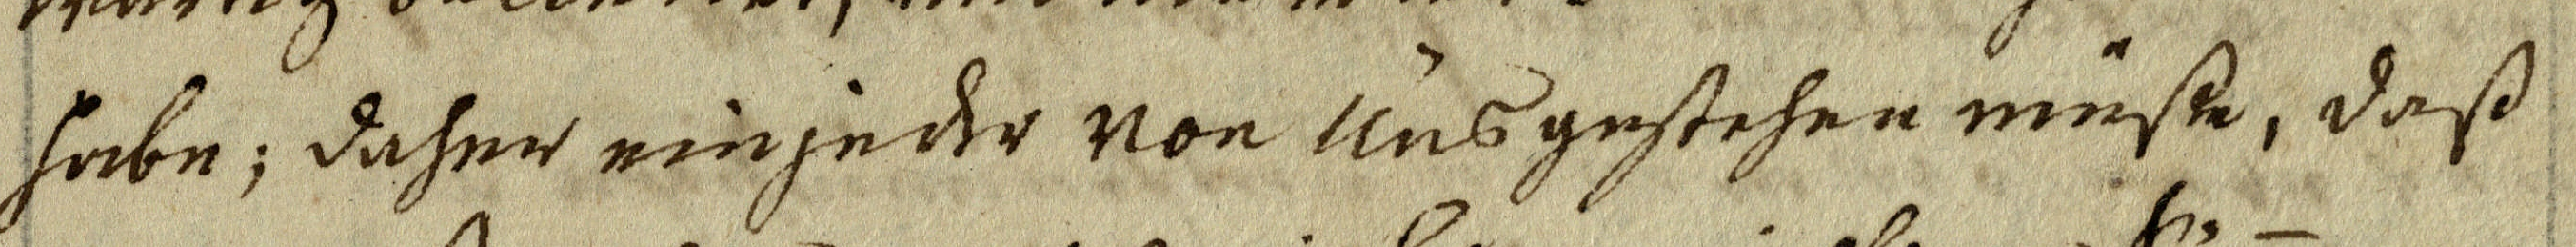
habe; daher ein jeder von uns gestehen müße, daß
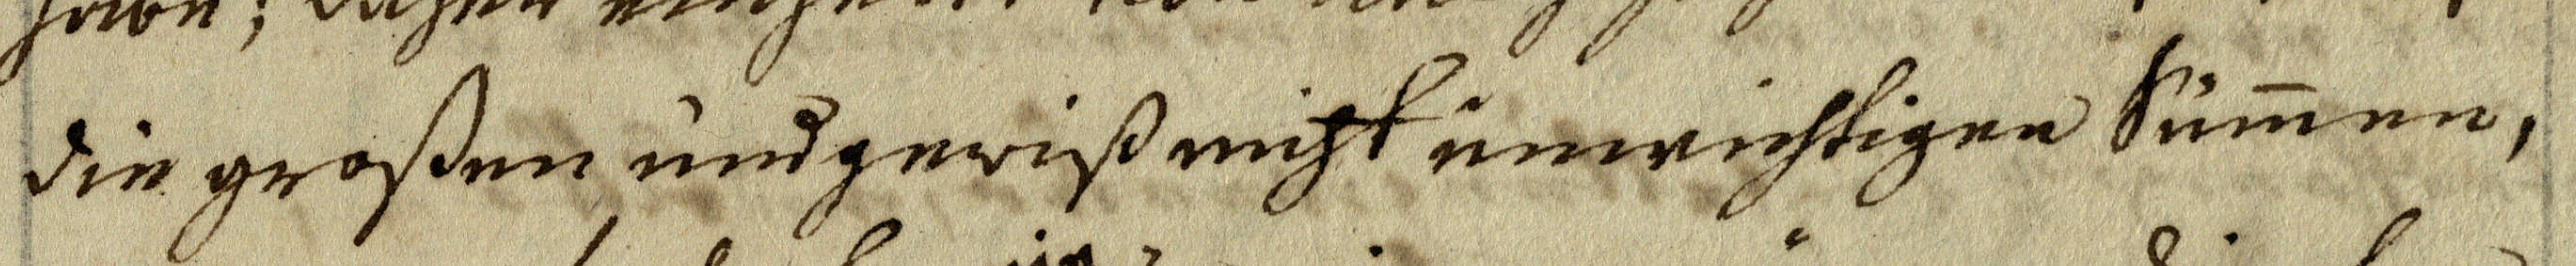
die großen und gewiß nicht unwichtigen Sumen,
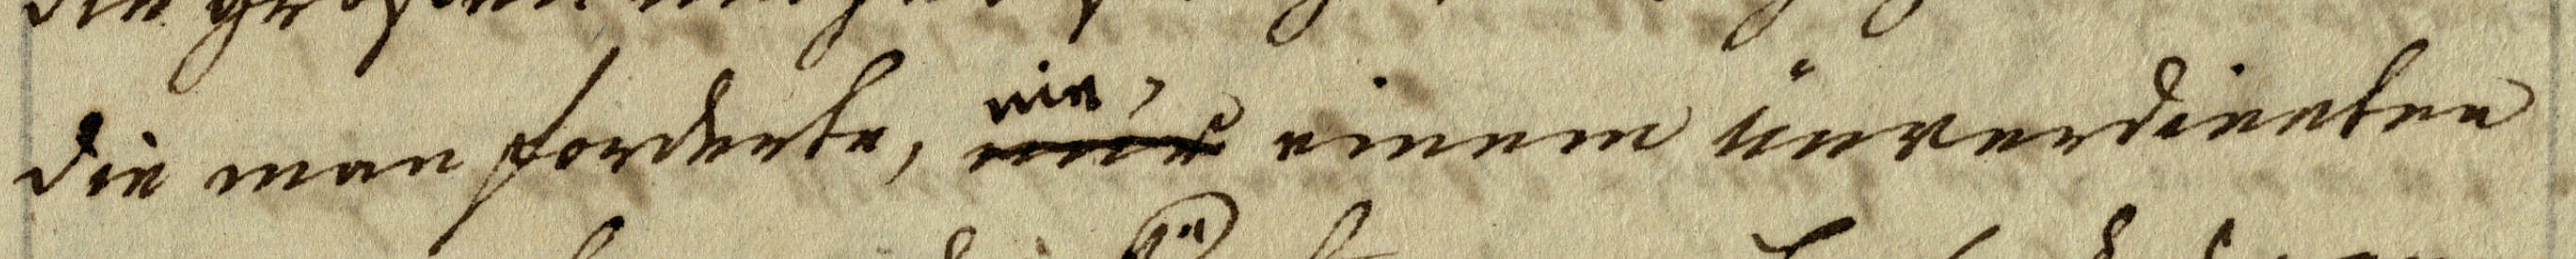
die man forderte, nie einem Unverdienten
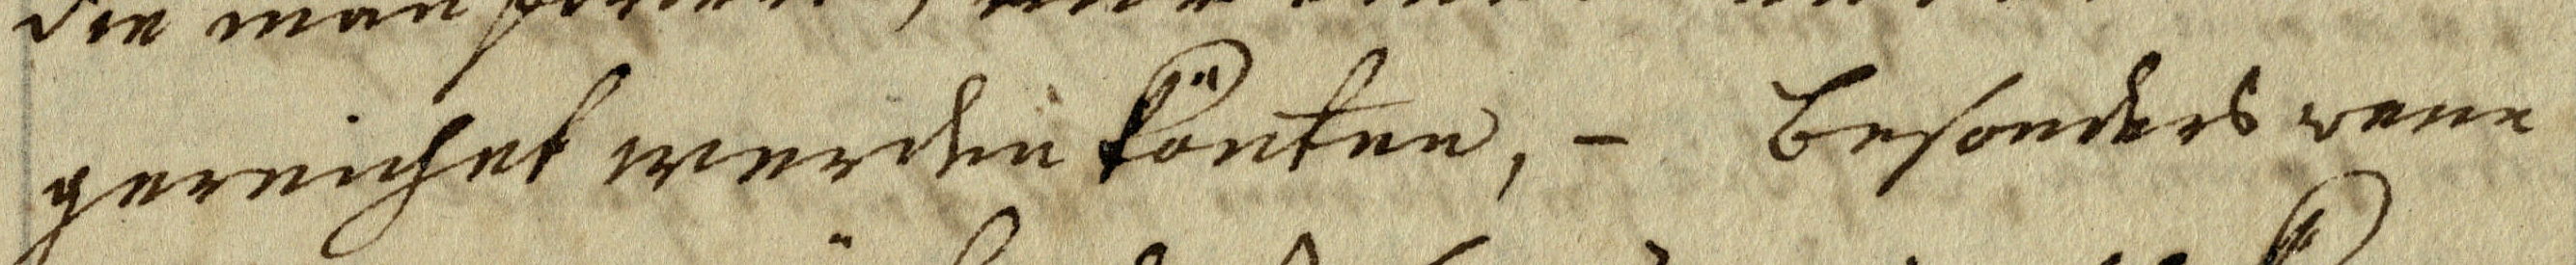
gereichet werden könten, - besonders wenn
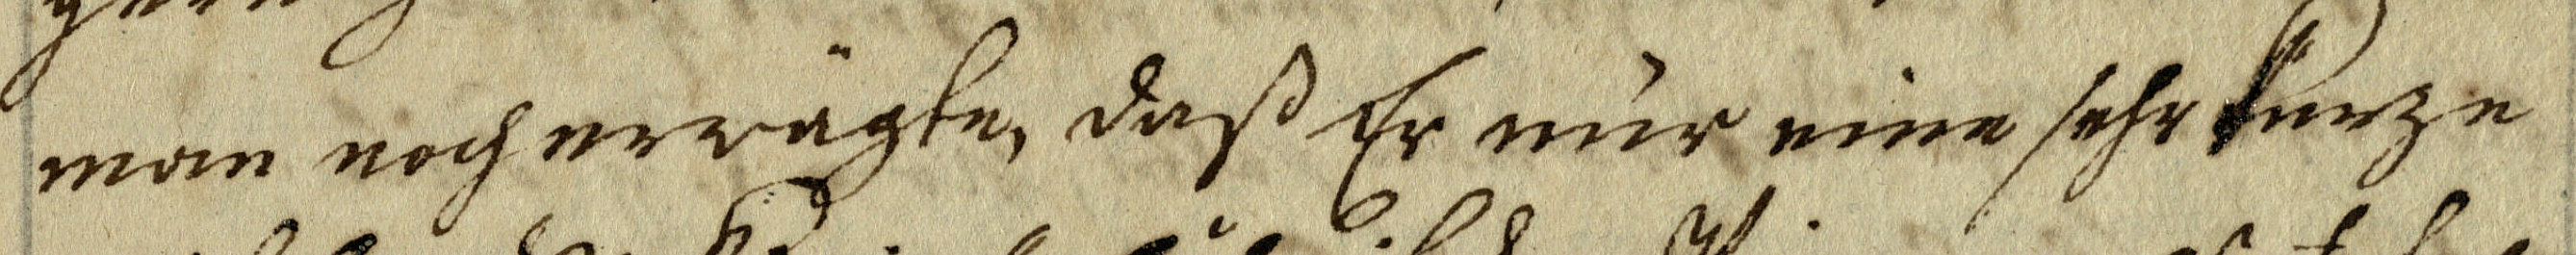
man noch erwägte, daß Er nur eine sehr kurze
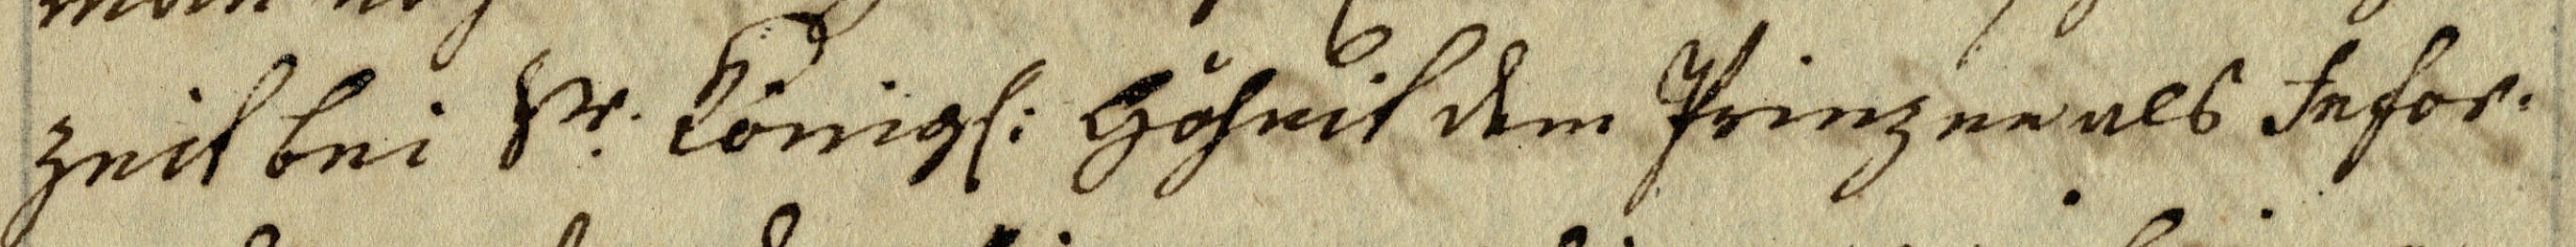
Zeit bei Sr. Königl. Hoheit dem Prinzen als Infor¬
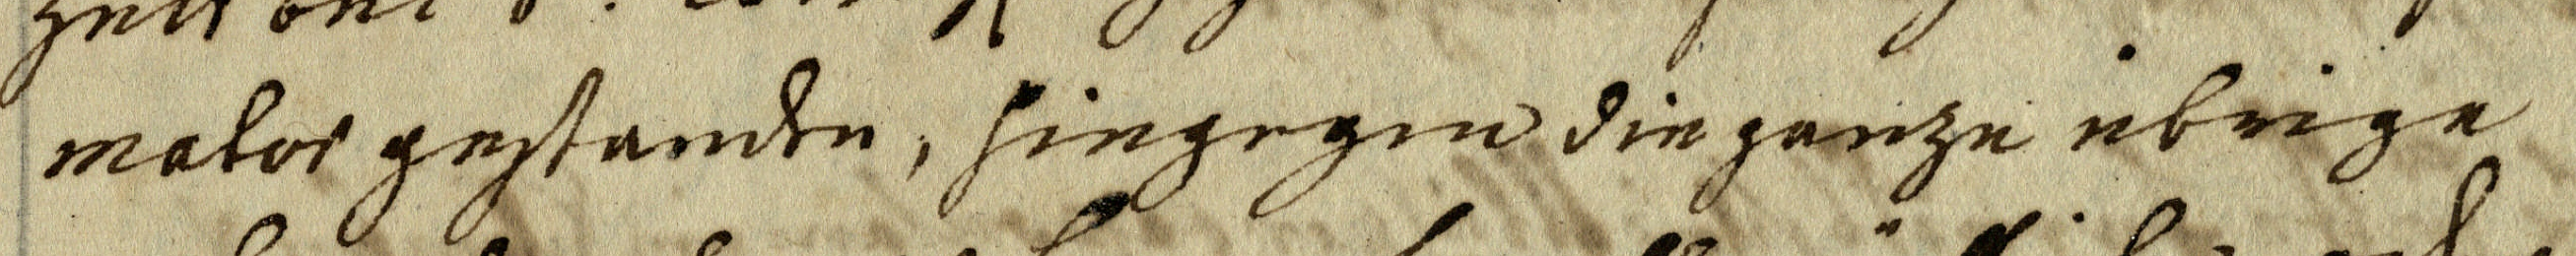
mator gestanden, hingegen die ganze übrige
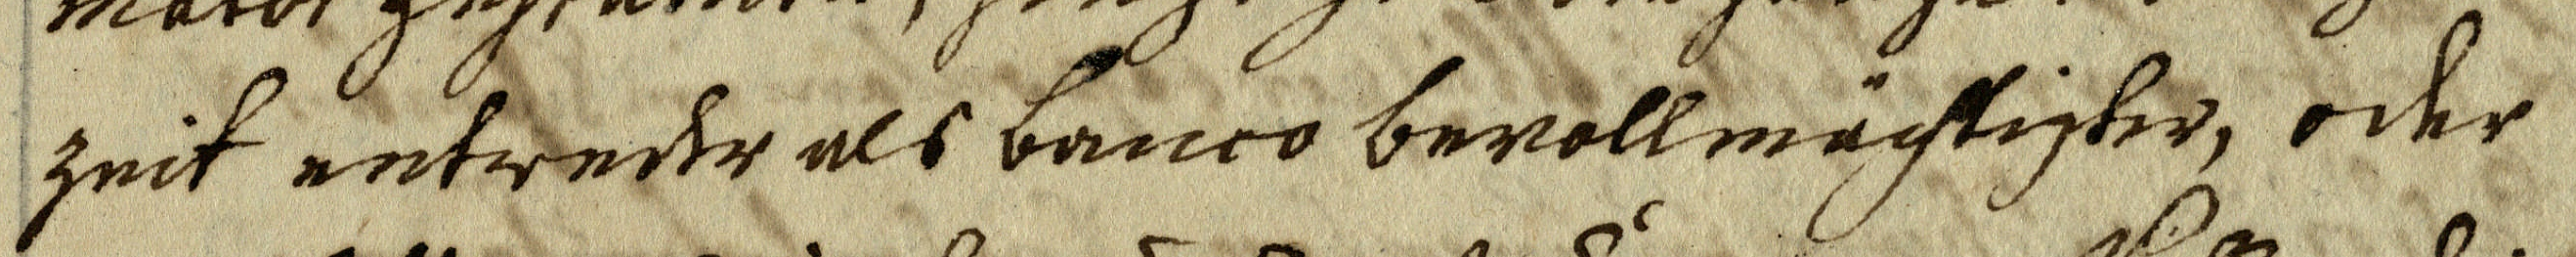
Zeit entweder als Banco Bevollmächtigter, oder
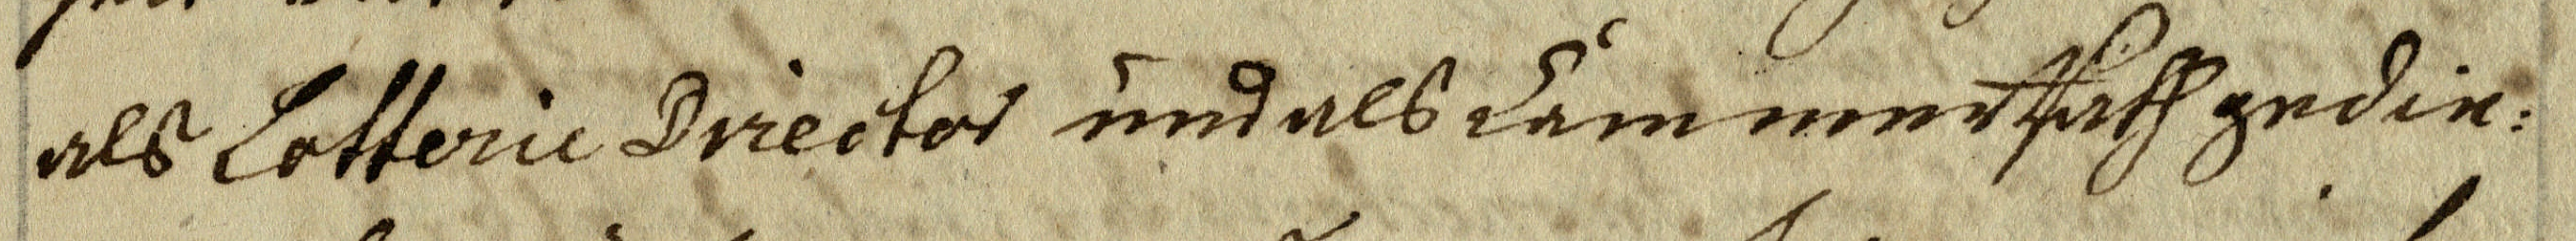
als Lotterie Director und als CammerRath gedie¬
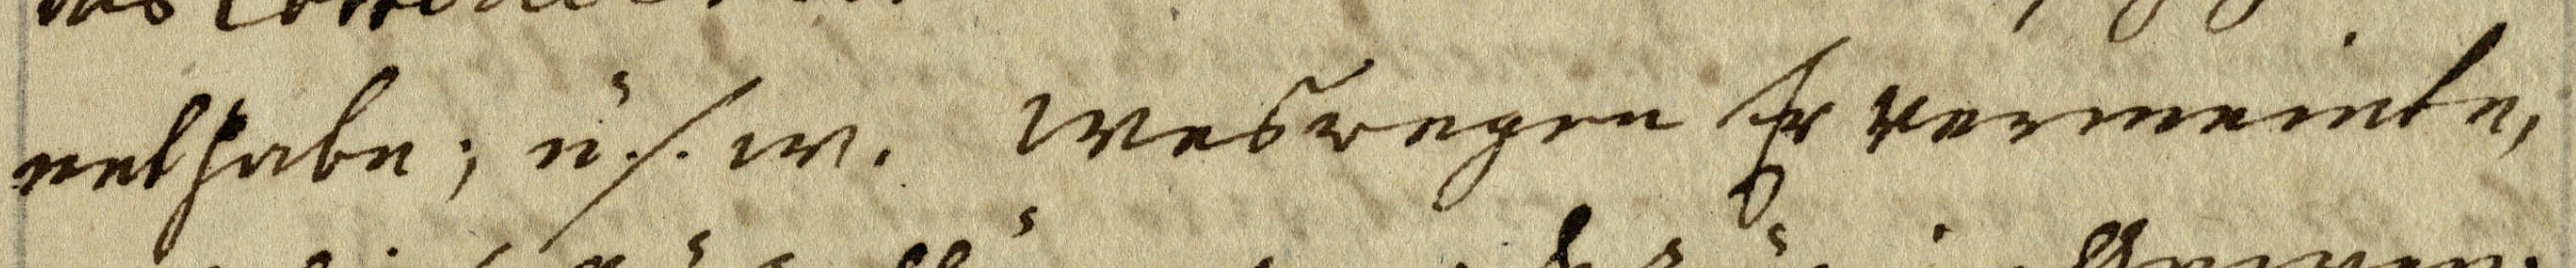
net habe; u.s.w. weswegen Er vermeinte,
